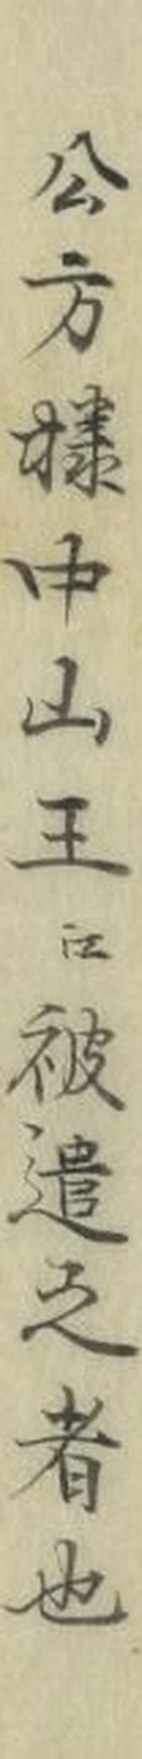公方様中山王え被遣之者也
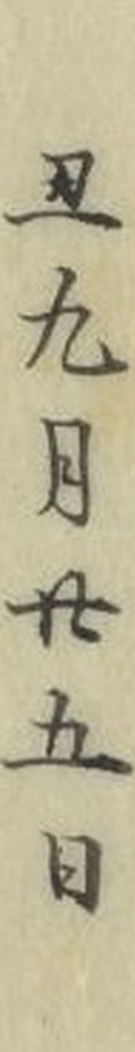丑九月廿五日
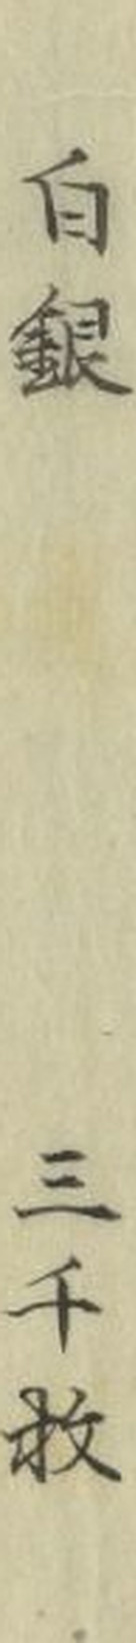白銀三千枚
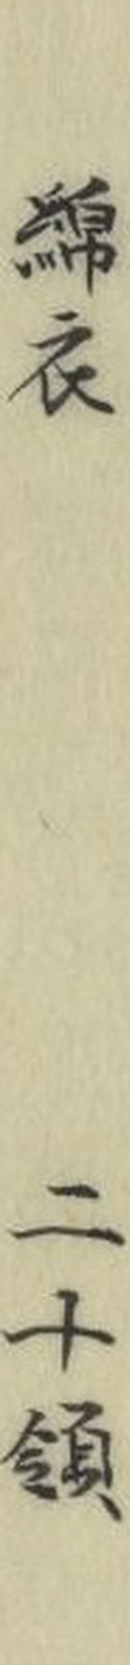綿衣二十領
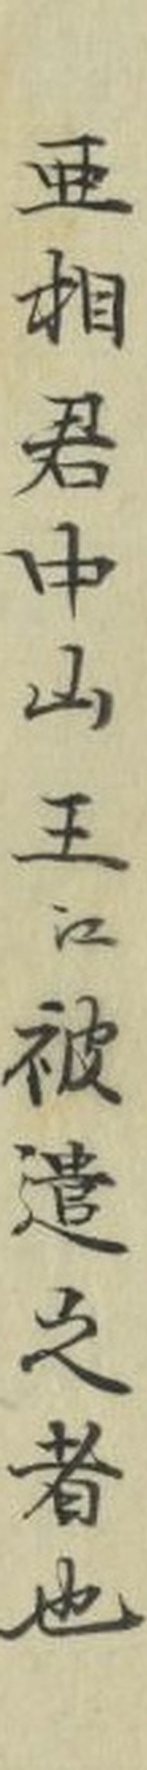亜相君中山王え被遣之者也
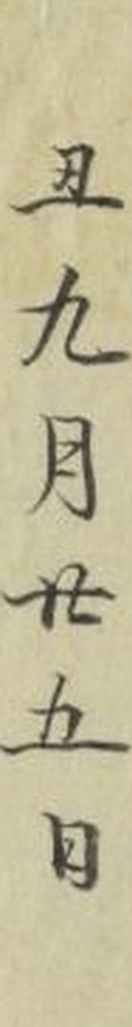丑九月廿五日
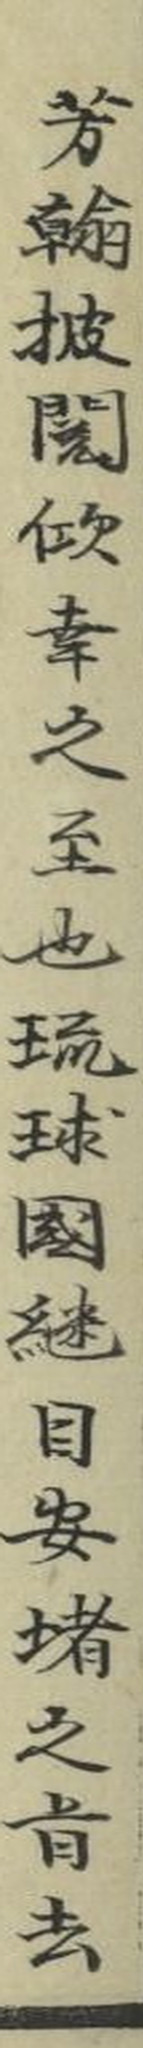芳翰被閲欣幸之至也琉球国継目安堵之旨去
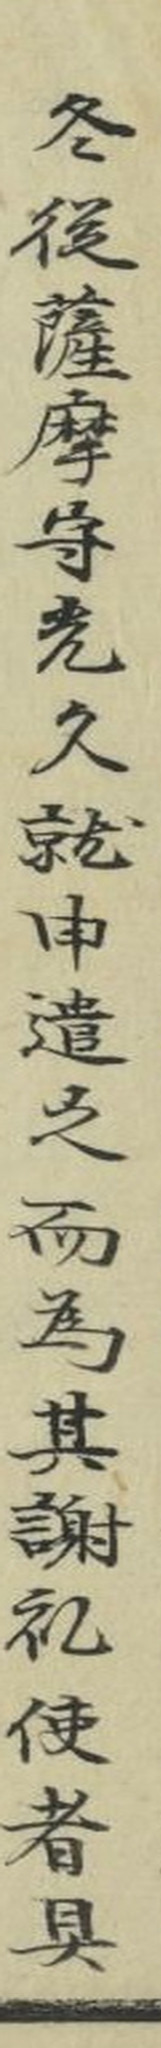冬従薩摩守充久就申遣之而為其謝礼使者具
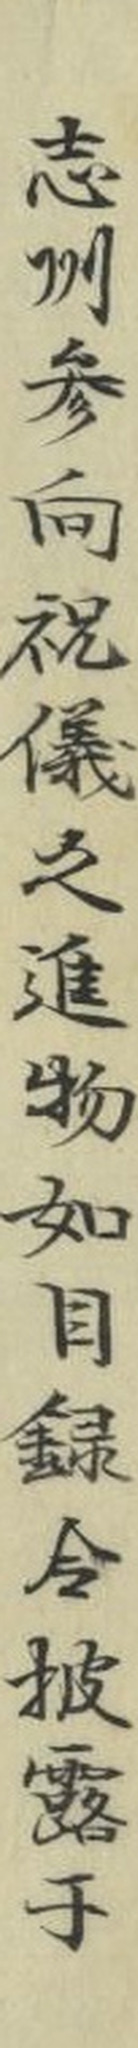志州参向祝儀之進物如目録令披露子
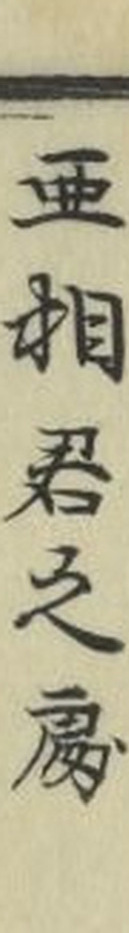亜相君之處
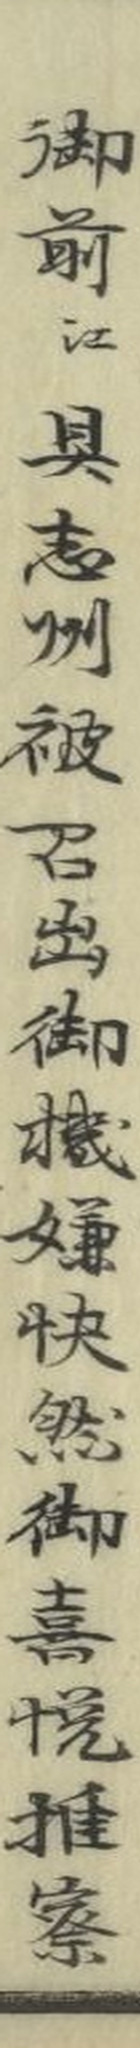御前え具志州被召出御機快然御喜悦推察
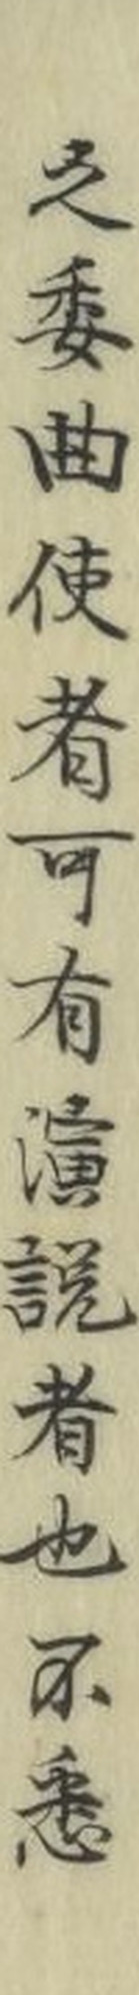之委曲使者可有演説者也不悉
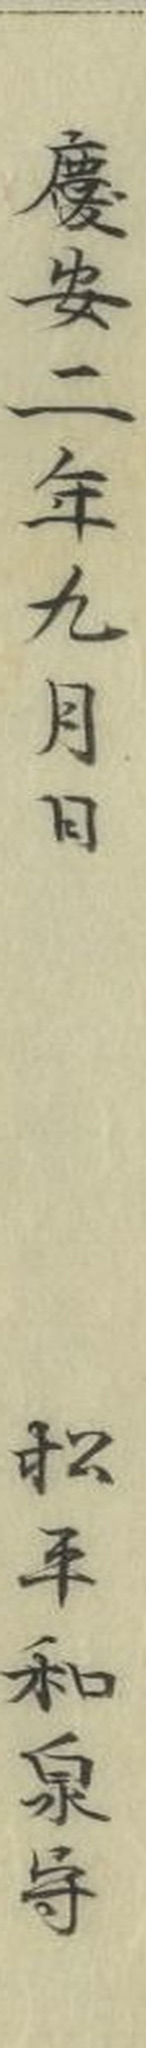慶安二年九月日松平和泉守
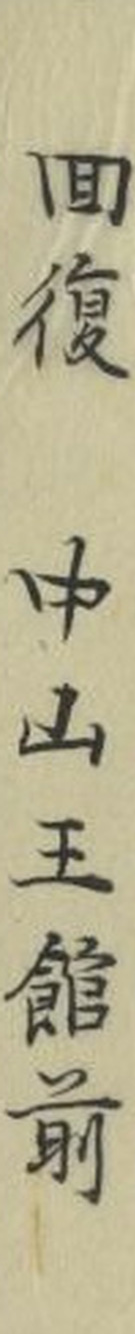回復中山王館前

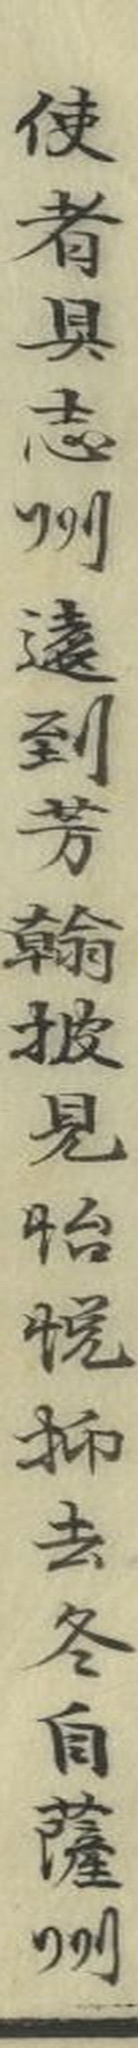使者具志州遠到芳翰披見怡悦抑去冬自薩州
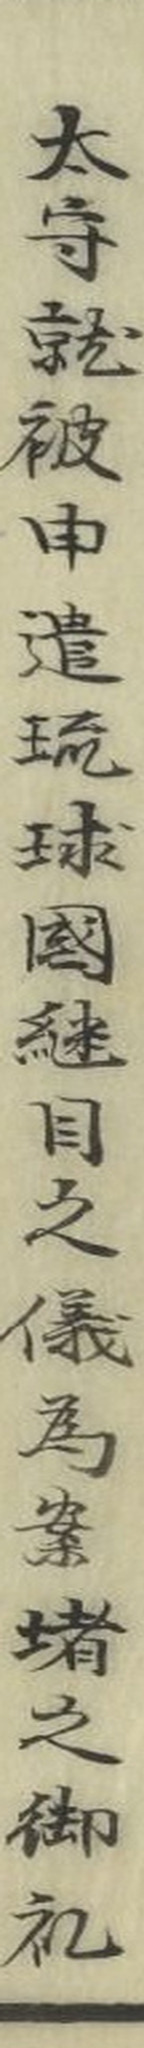太守就被申遣琉球国継目之儀為安堵之御礼
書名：琉球往来（上）
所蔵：University of the Ryukyus Library
